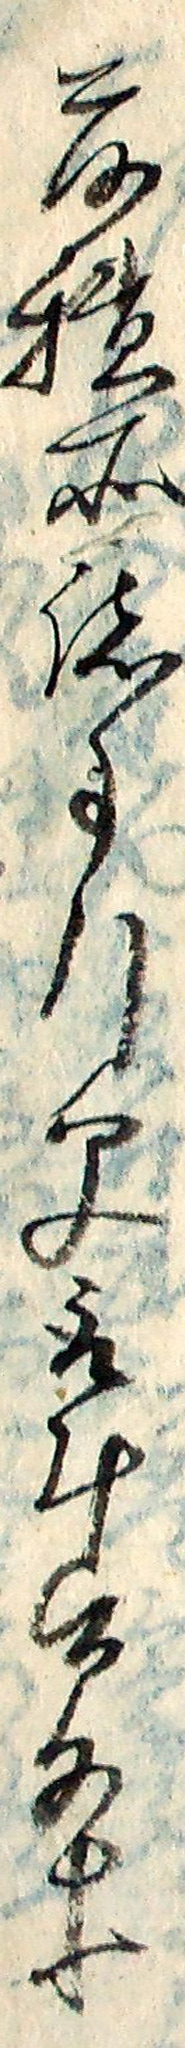荷積所諸事引受取計候条

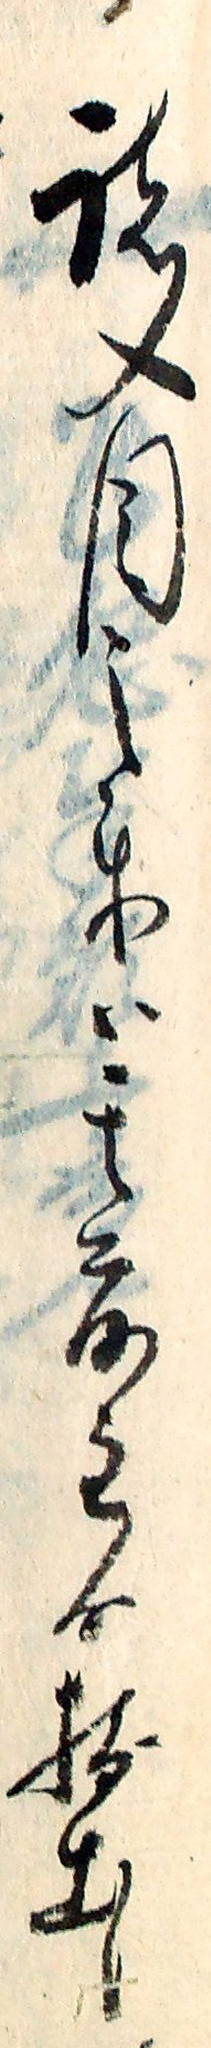諸入目之義は其荷主ゟ指出し
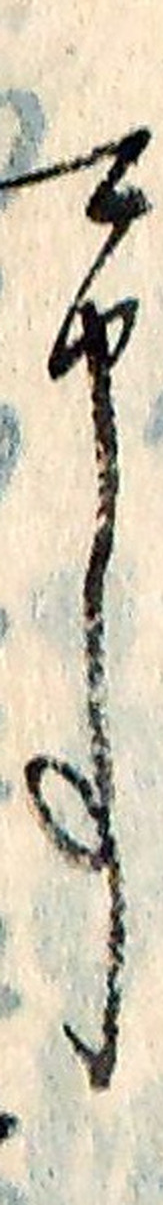可申事
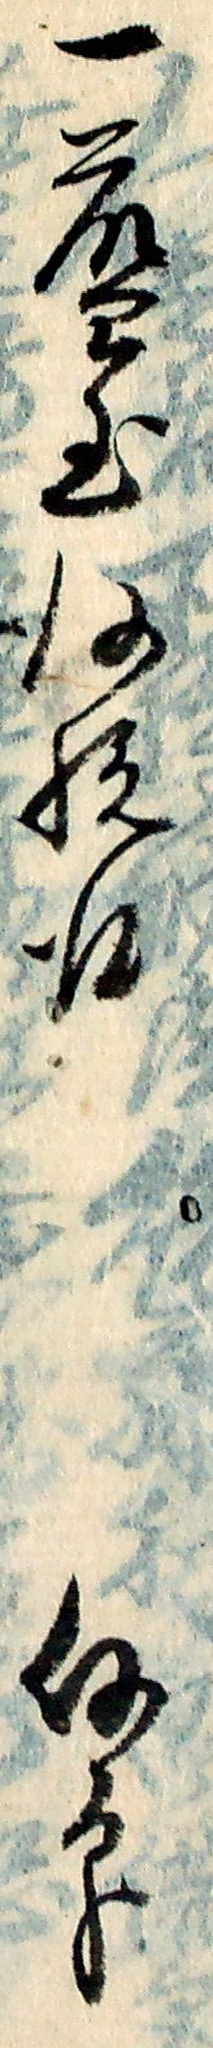一藍玉何拾何何兵衛
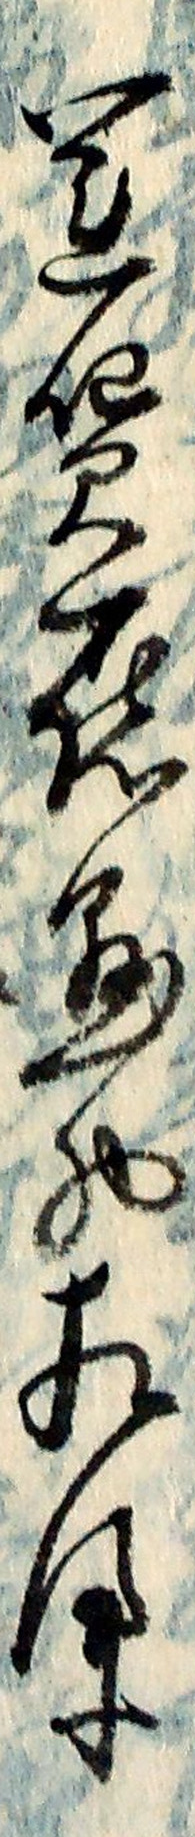運賃諸懸物相済
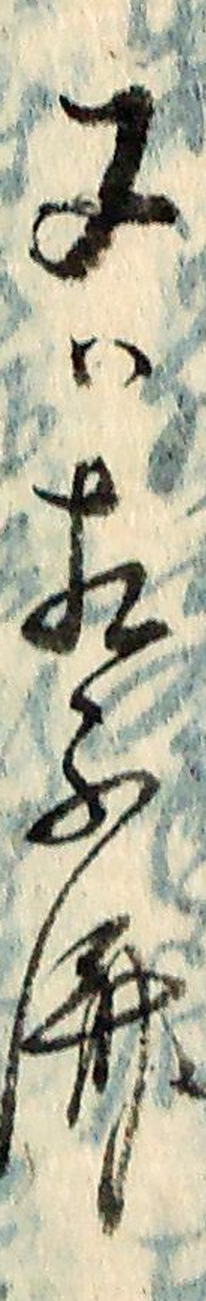又は相不済
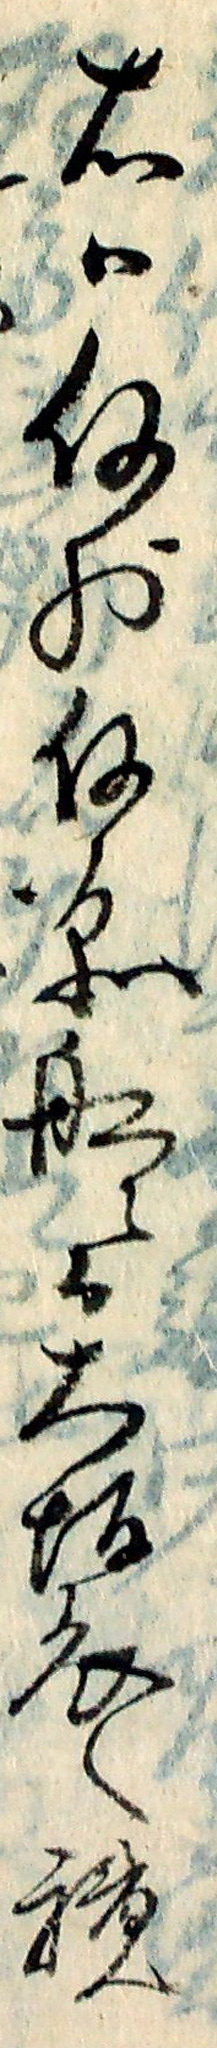右は何村何兵衛船にて大坂表へ積
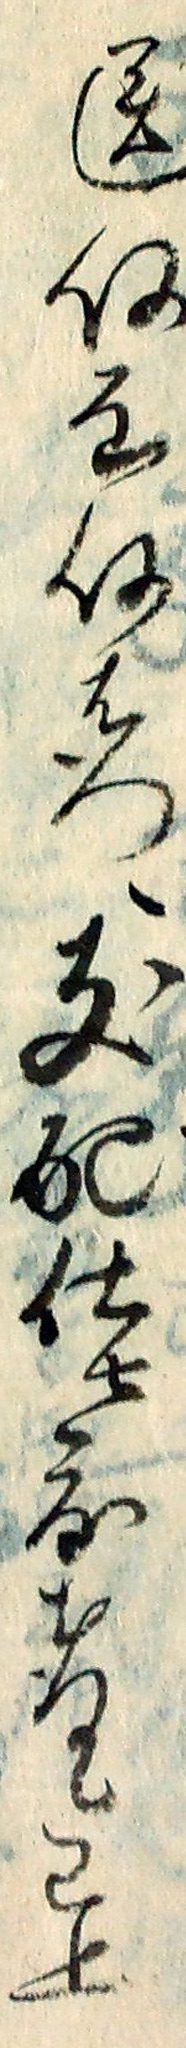送何屋何右衛門へ支配仕せ度奉存候已上
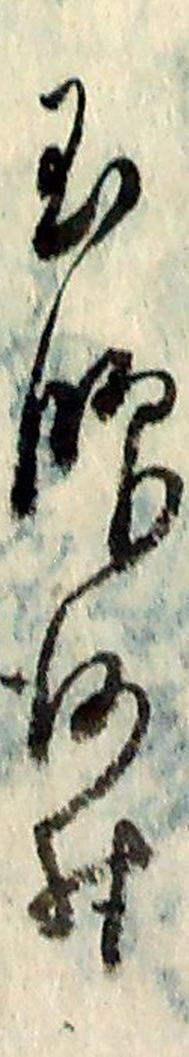玉師何村
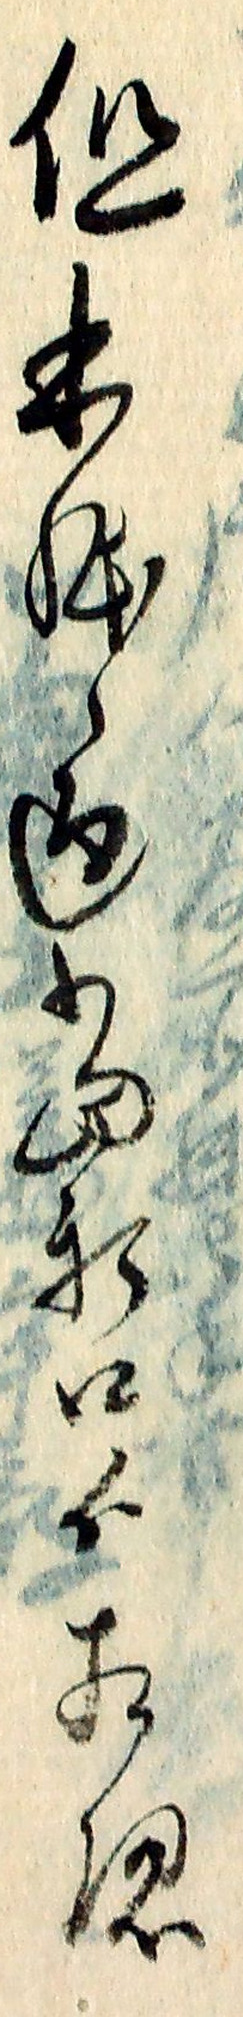但本紙之通当新口ゟ相認
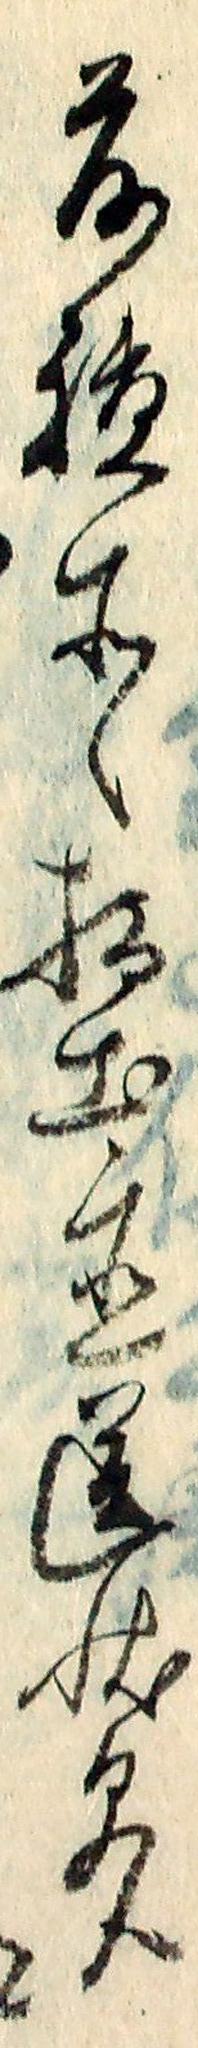荷積所へ指出置送状受取
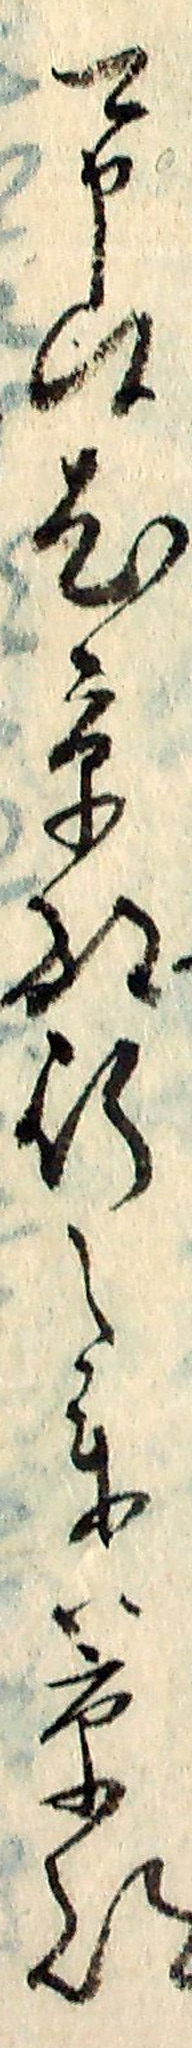可申候尤京都行之義は京都
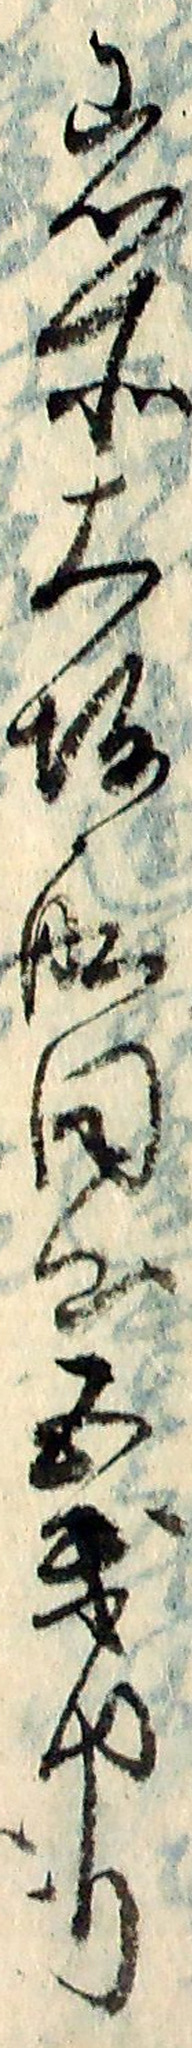着所大坂船問屋五畿内行
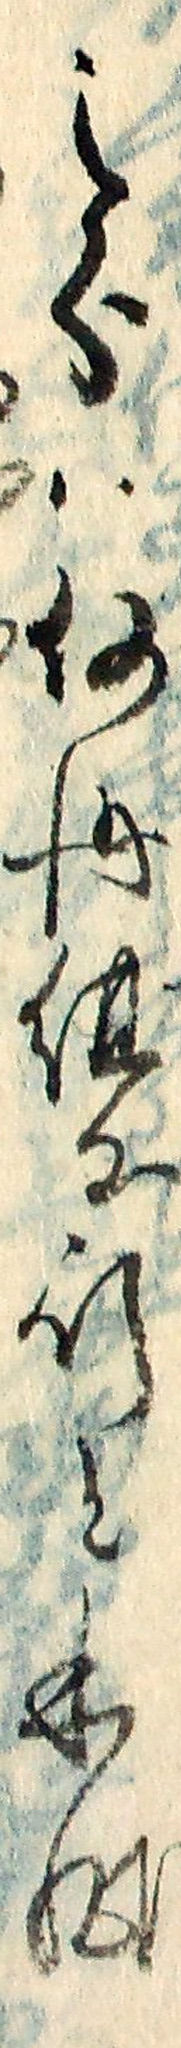之分は何州紺屋行迄本紙
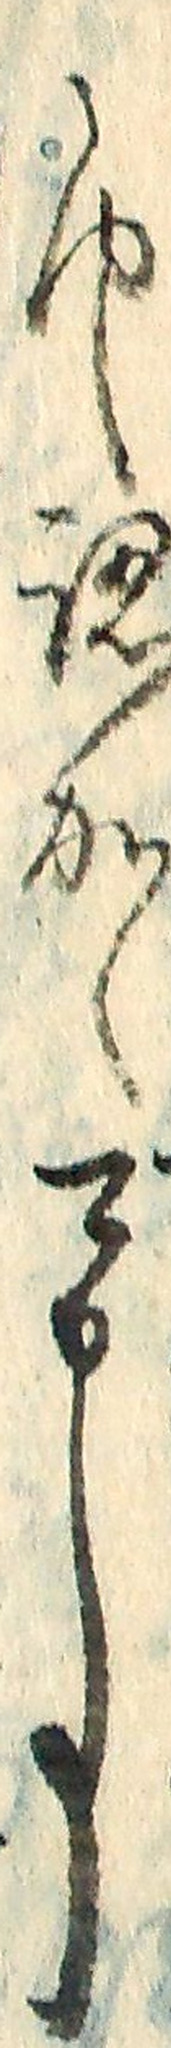之中へ認加へ可申事
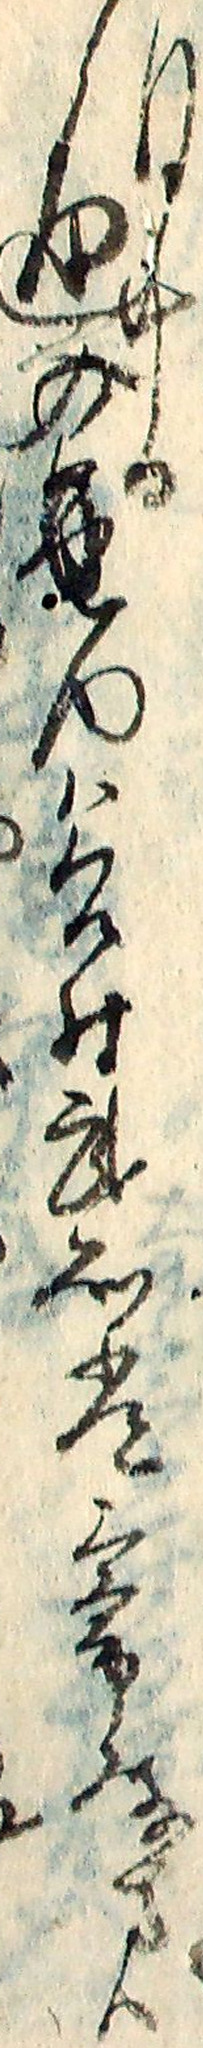右之通内谷村武石常三郎殿方ゟ
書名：諸御願書控(後藤氏壱番）
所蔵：鳴門教育大学 Naruto University of Education
